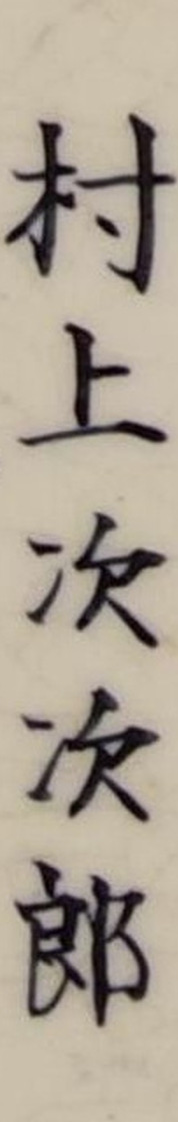村上次次郎
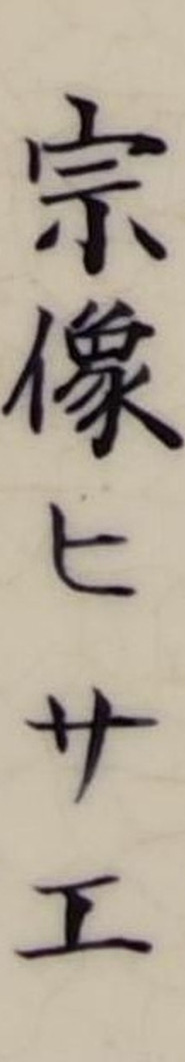宗像ヒサエ
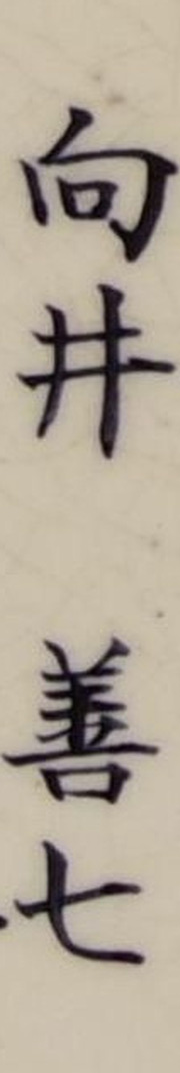向井善七
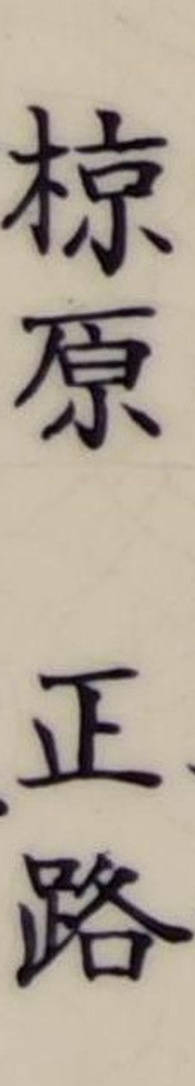椋原正路
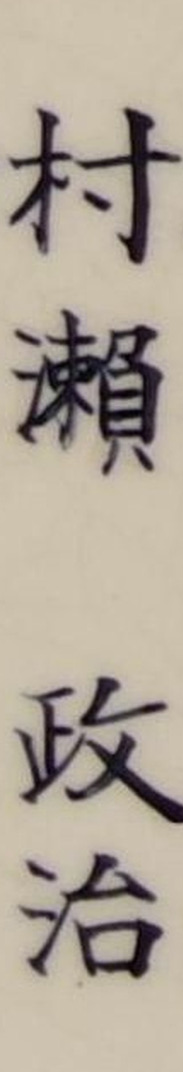村瀬政治
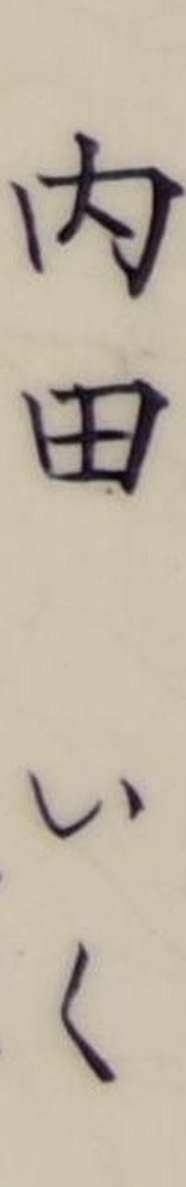内田いく

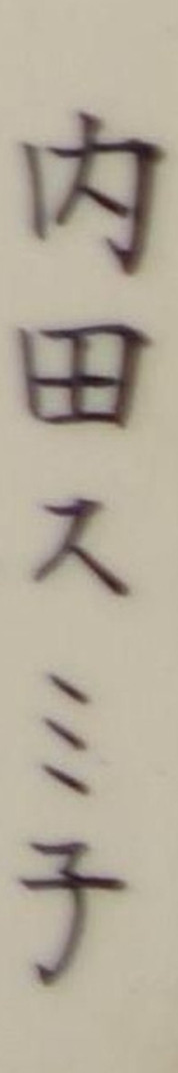内田スミ子
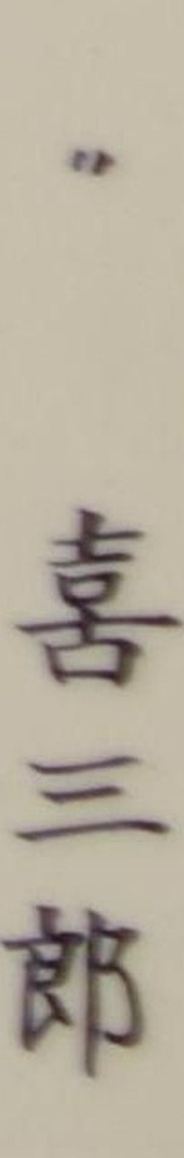喜三郎
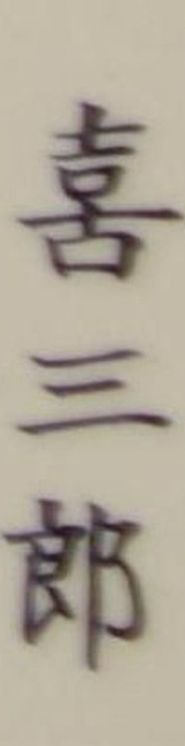喜三郎
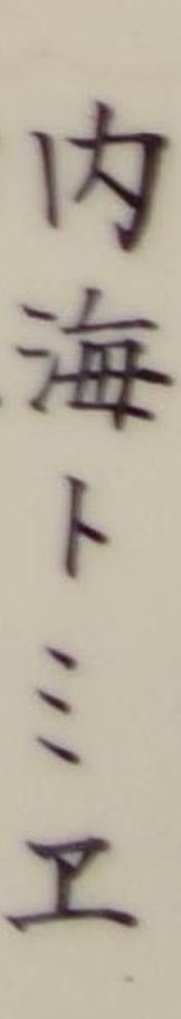内海トミエ
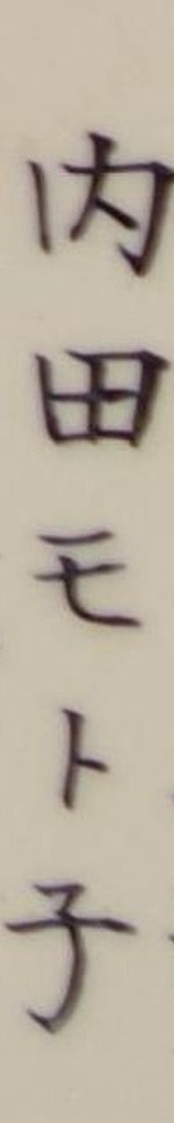内田モト子
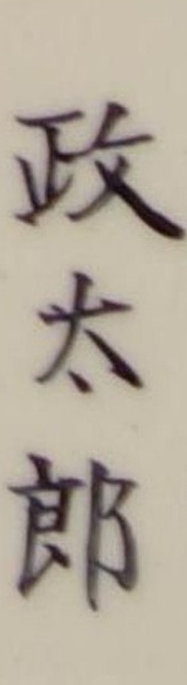政太郎
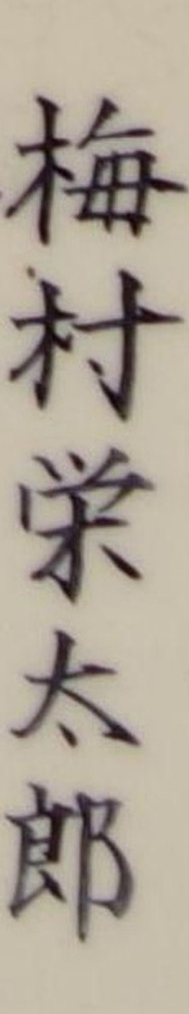梅村栄太郎
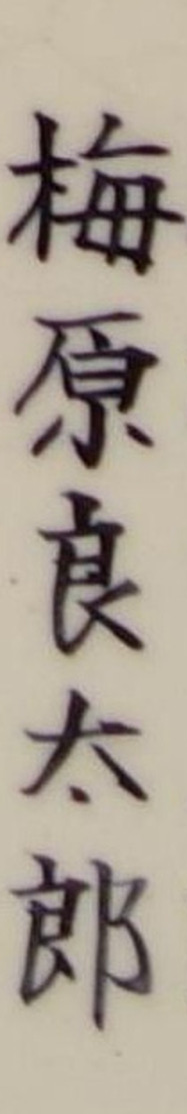梅原良太郎
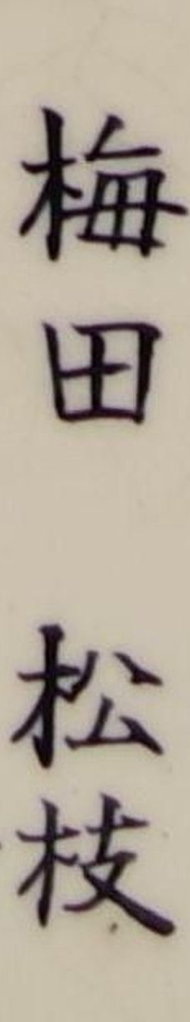梅田松枝
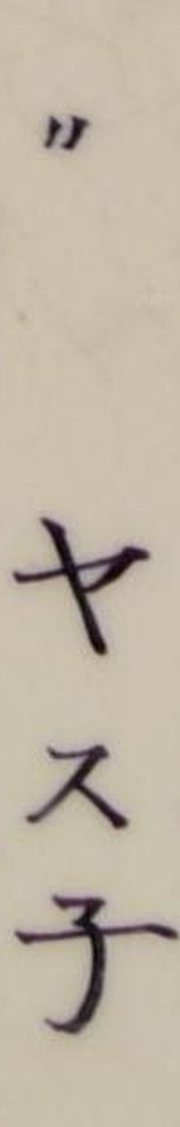ヤス子
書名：M~S
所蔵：高野山金剛峯寺
